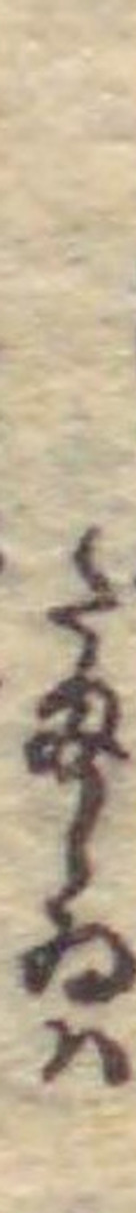たましゐは
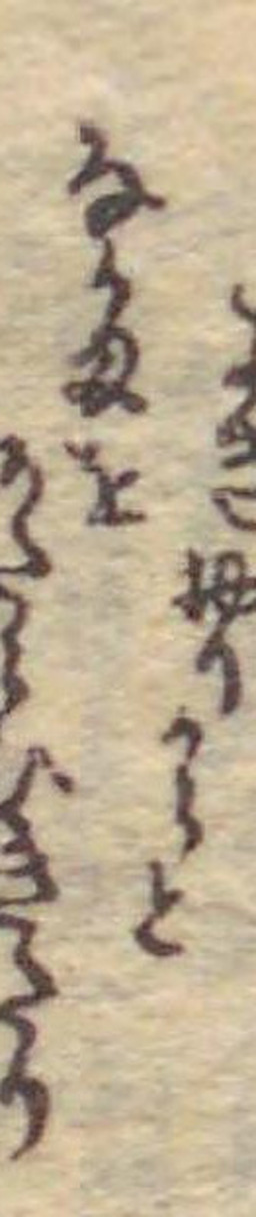なかまを
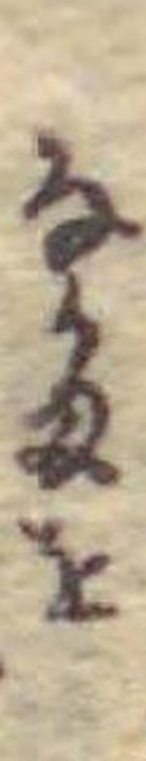なかまを
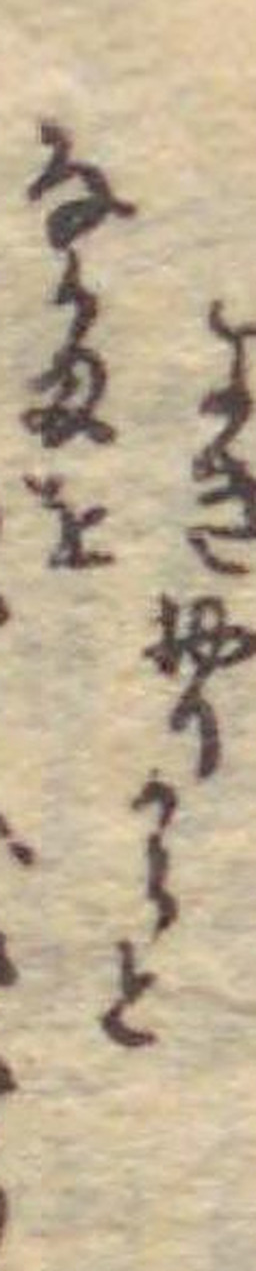なかまを
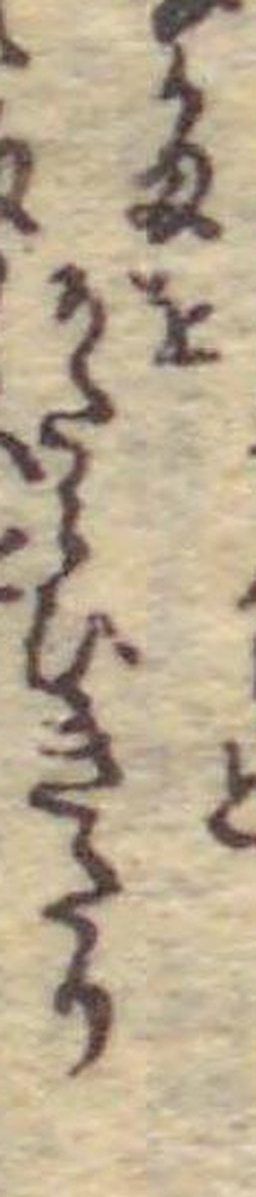かたらひきたり
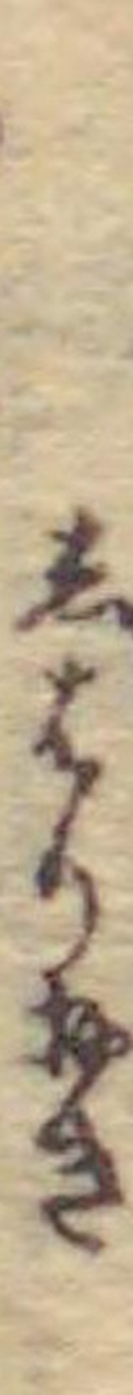しはりおき
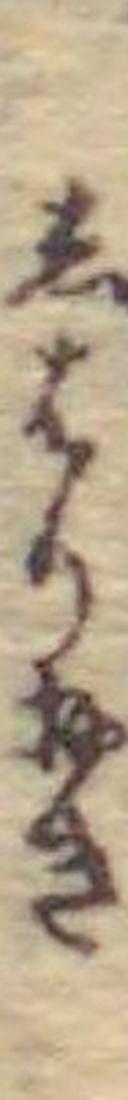しはりおき
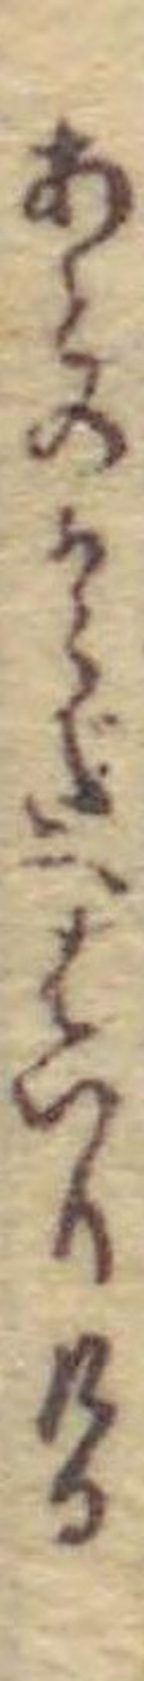あとのからだへはいりける

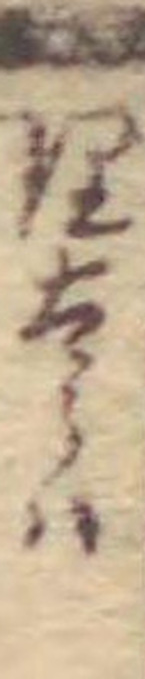理太郎は
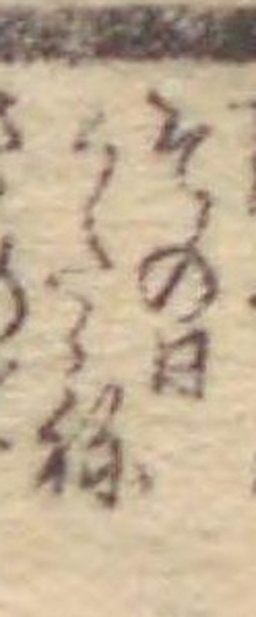さめて
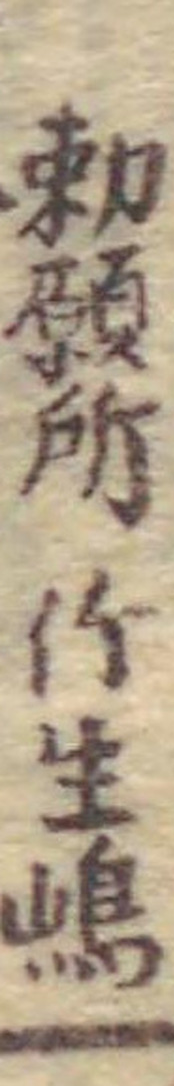勅願所竹生島
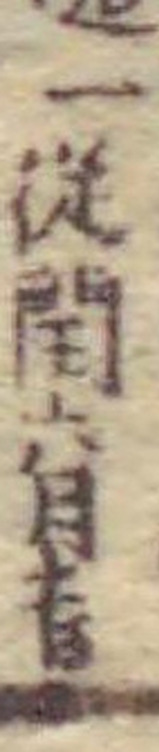従閏六月十一？日
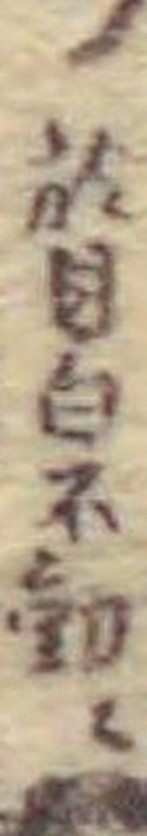於目白不動に
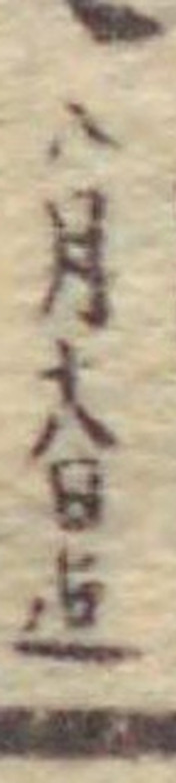八月十八日迄
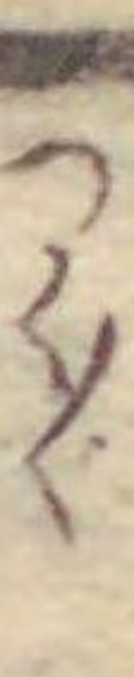つく〴〵
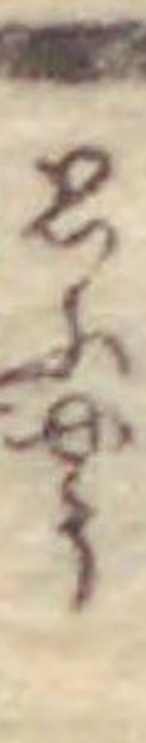思ふやう
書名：心学早染艸 : 3巻
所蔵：国立国会図書館 National Diet Library, JAPAN
